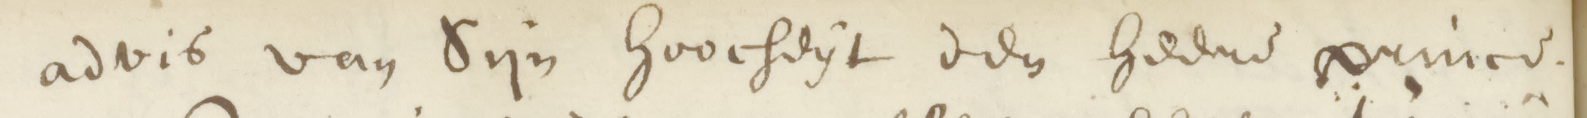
advis van Sijn hoocheijt den heere prince
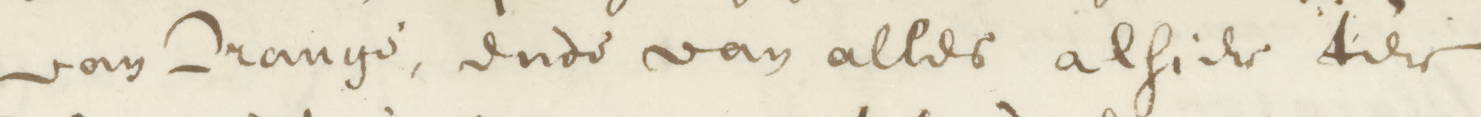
van Orange, ende van alles alhier ter
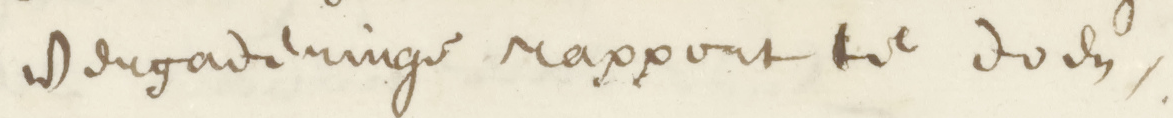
Vergaderinge rapport te doen.
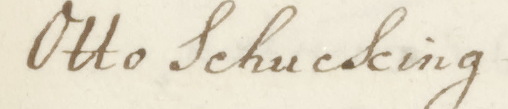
Otto Schucking
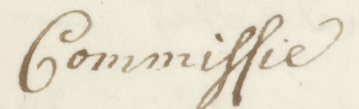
Commissie
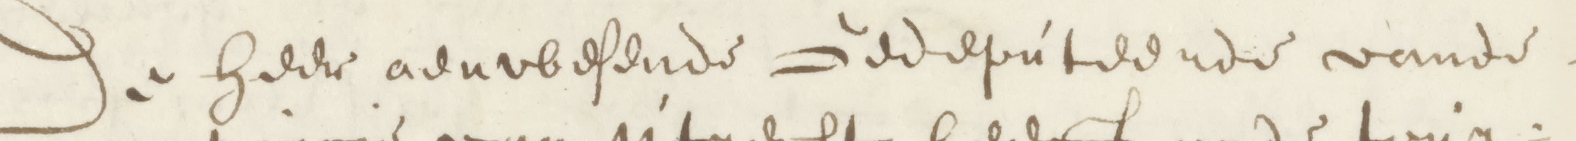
De heer aenwesende Gedeputeerde vande
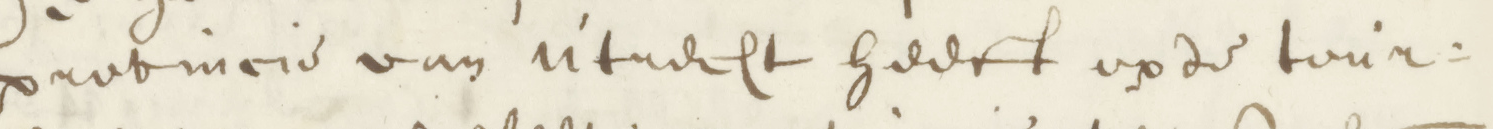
provincie van Utrecht heeft opde tour„
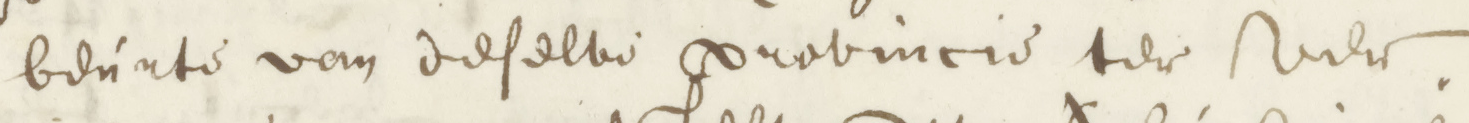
beurte van deselve provincie ter Ver„
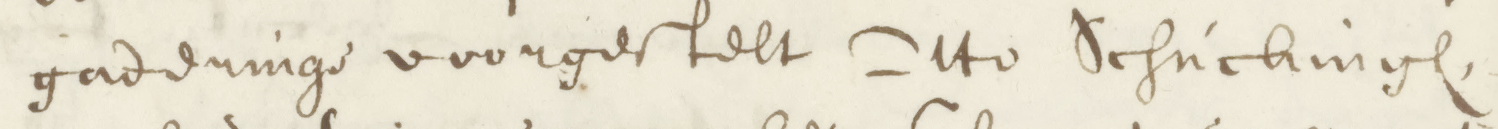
gaderinge voorgestelt Otto Schuckingh,
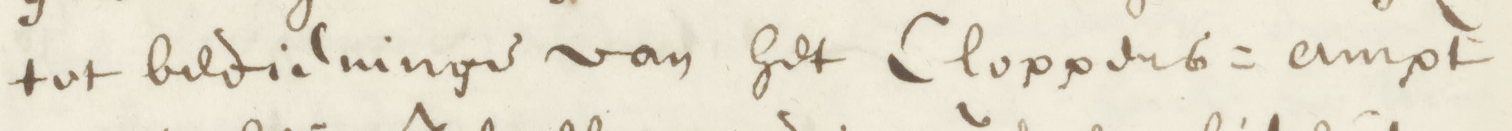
tot bedieninge van het Cloppers=ampt
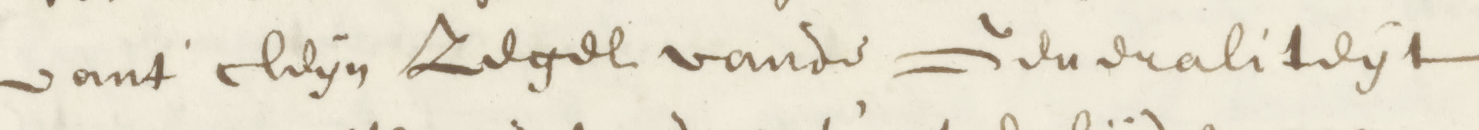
vant cleijn Zegel vande Generaliteijt,
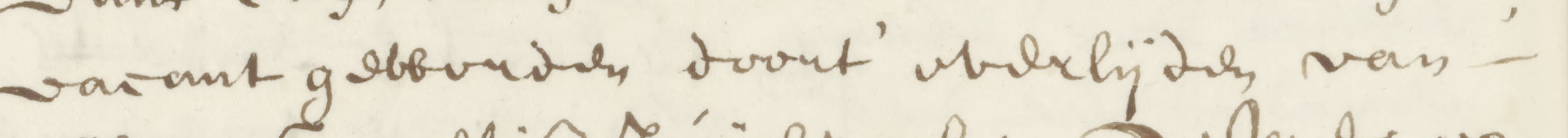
vacant geworden doort‛ overlijden van —
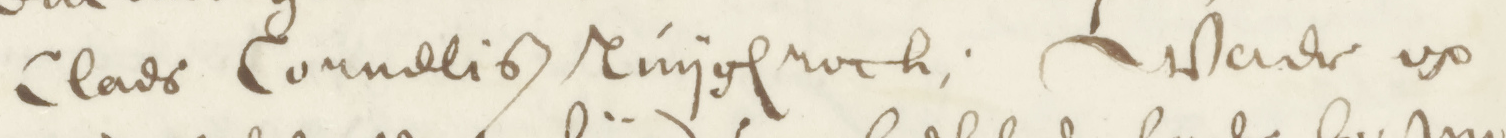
Claes Cornelis Ruijghrock; Waer op
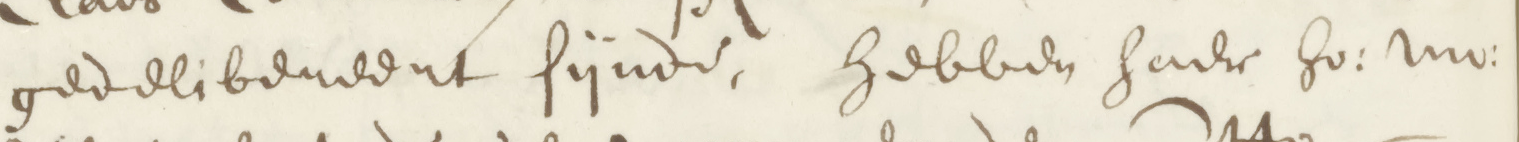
gedelibereert sijnde, hebben haer ho:Mo:
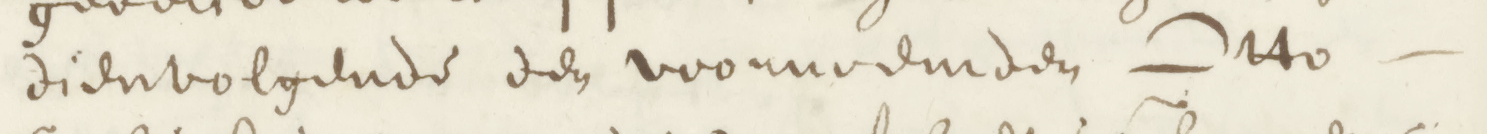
dienvolgende den voornoemden Otto —
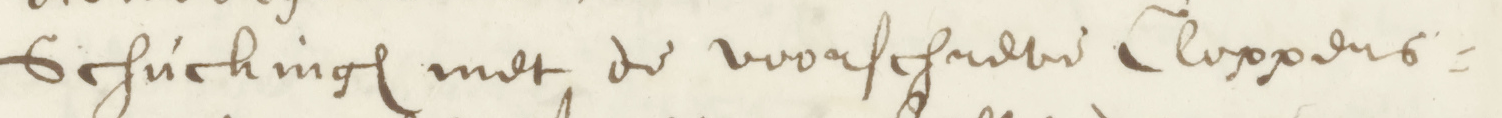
Schuckingh met de voorschreve Cloppers„
